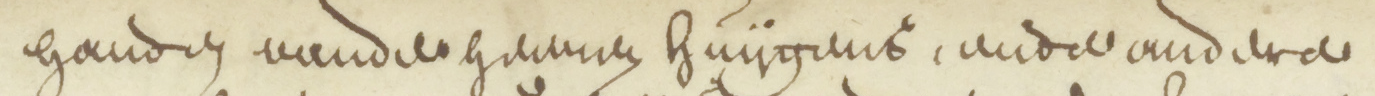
handen vande heeren Huijgens, ende andere —
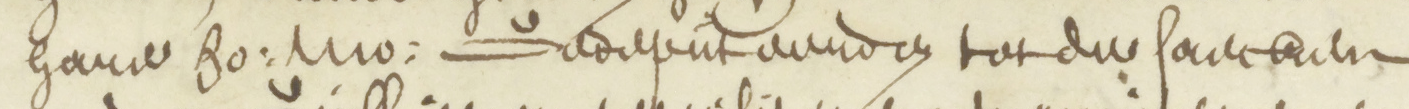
hare Ho:Mo: Gedeputeerden tot de saecken
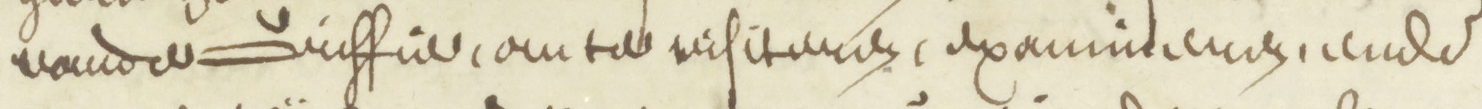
vande Griffie, om te visiteren, examineren, ende
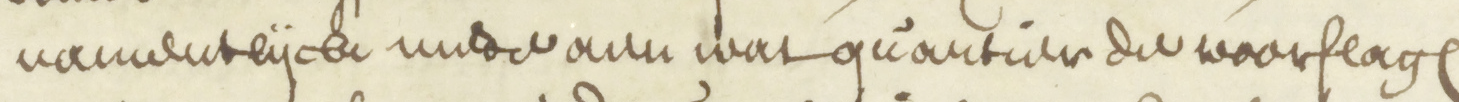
namentlijck mede aen wat quartier de voorslagh
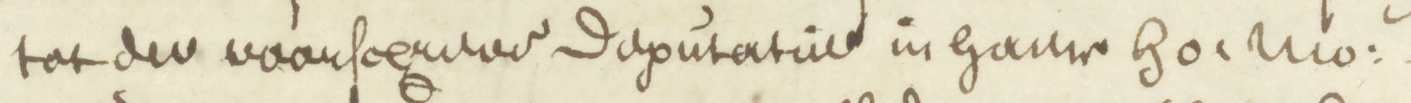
tot de voorschreve Deputatie in haer Ho:Mo: —
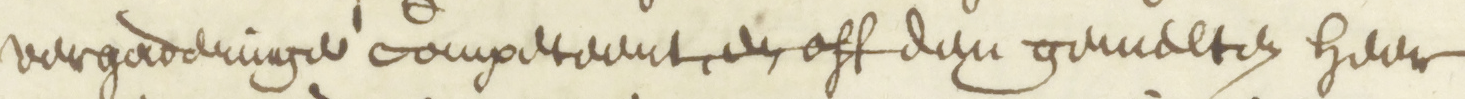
vergaderinge competeert, en off den gemelten heer
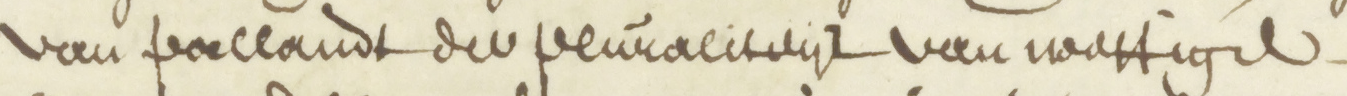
van pallandt de pluraliteijt van wettige
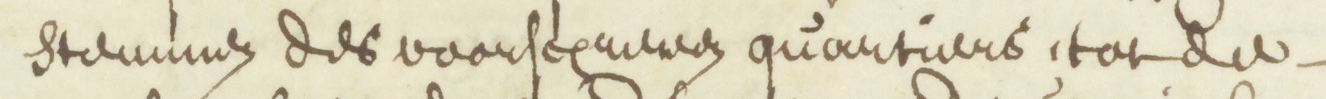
stemmen des voorschreven quartiers, tot de —
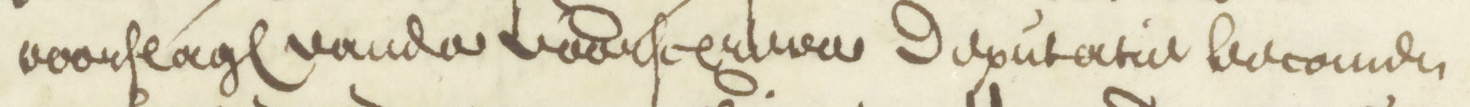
voorslagh vande voorschreve Deputatie becomen —
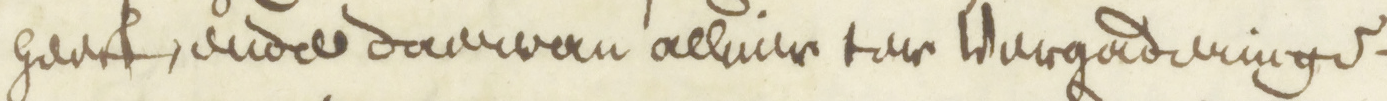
heeft, ende daervan alhier ter Vergaderinge —
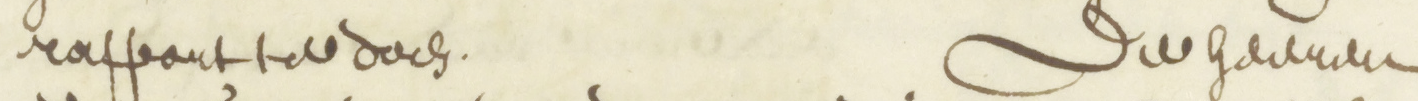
rapport doen. De heeren
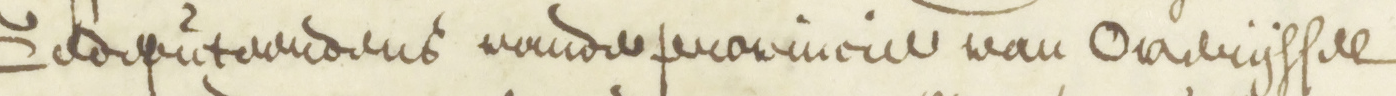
Gedeputeerdens vande provincie van Overijssel
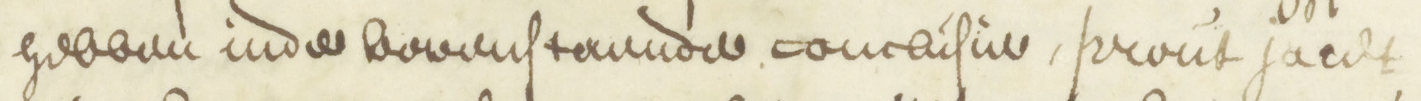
hebben inde bovenstaende conclusie, prout jacet,
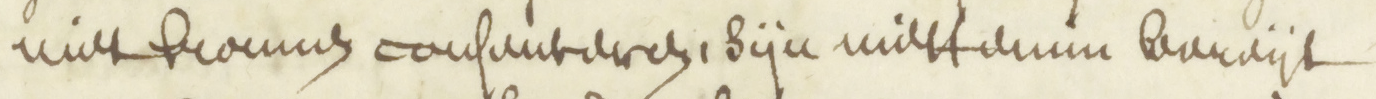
niet konnen consenteren, sijn niettemin bereijt
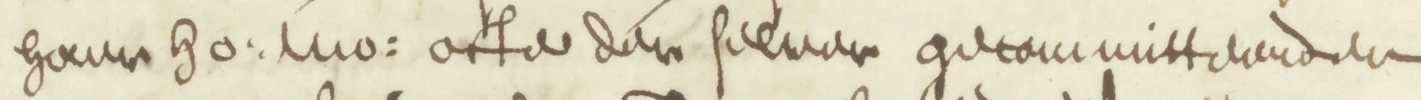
haer Ho:Mo: ofte der selver gecommitteerden
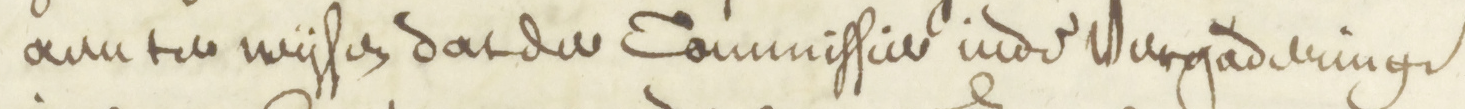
aen te wijsen dat de Commissie inde Vergaderinge
